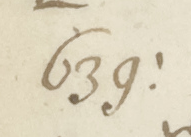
639:
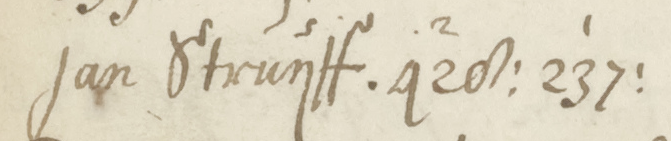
Jan Struijff. 4228: 2317:
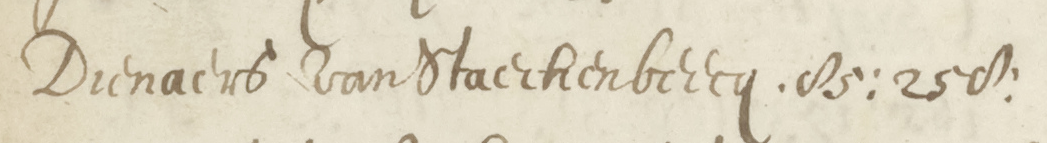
Dienaers van Staeckenbeecq. 85: 258:
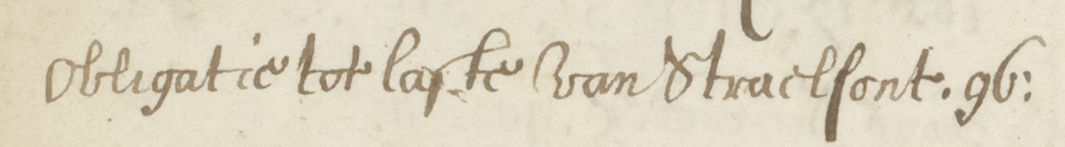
Obligatie tot laste van Straelsont. 96:
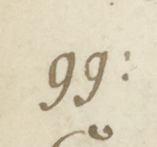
99:
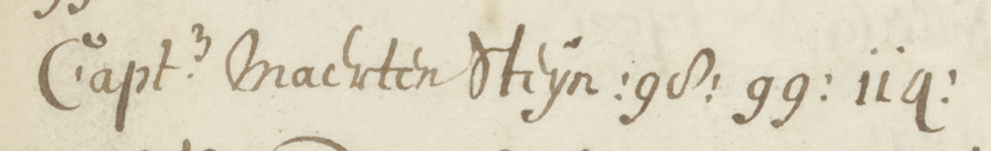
Captn. Maerten Steijn: 98: 99: 114:
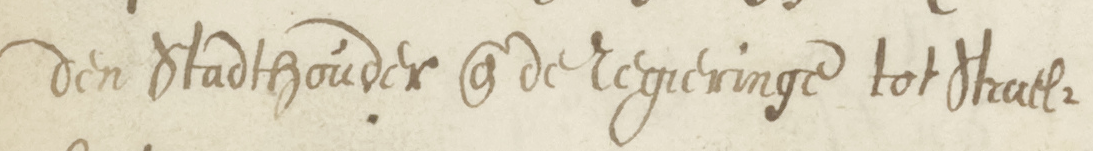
den Stadthouder & de Regieringe tot Strael„
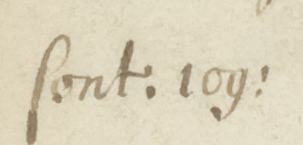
sont. 109:
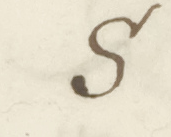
S
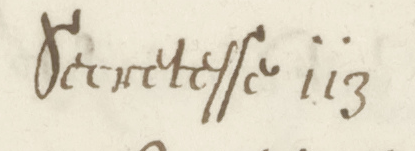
Secretesse 113
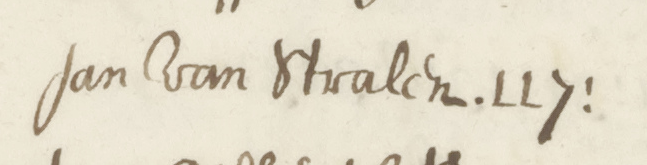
Jan van Stralen. 117:
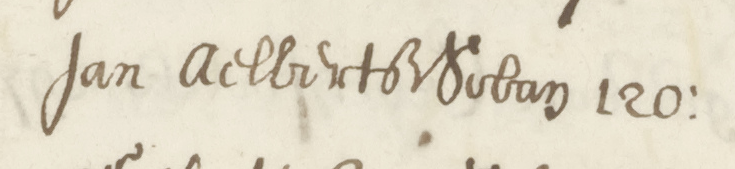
Jan Aelberts Swan 120:
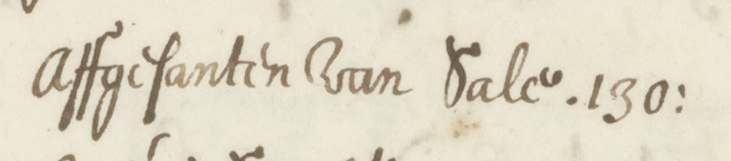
Affgesanten van Sale. 130:
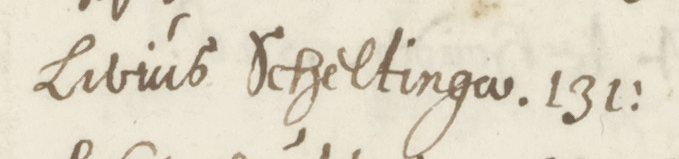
Livius Scheltinga. 131:
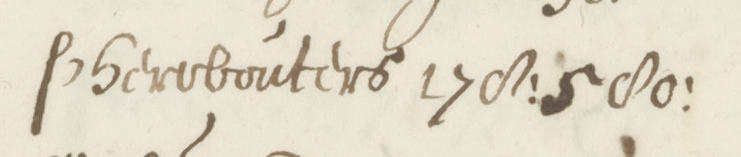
s‛herwouters 178: 580:
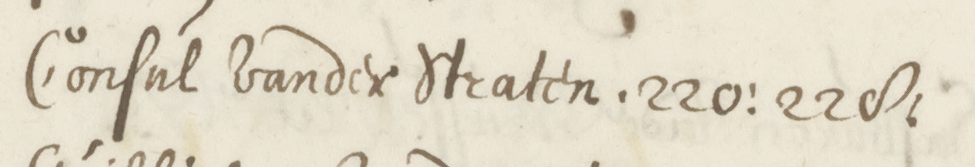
Consul vander Straten. 220: 228:
